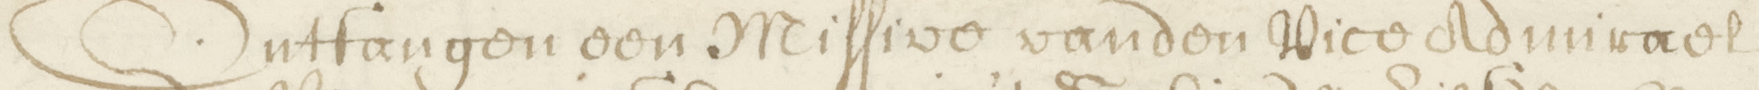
Ontfangen een missive vanden Vice Admirael
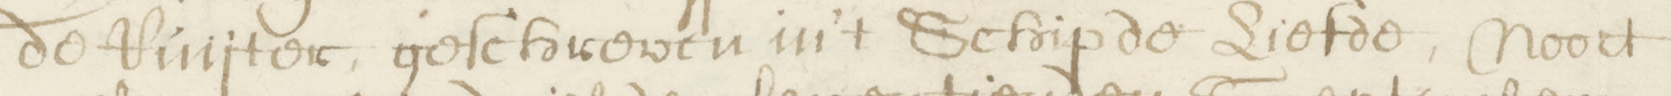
de Ruijter, geschreven in't schip de Liefde, Noort
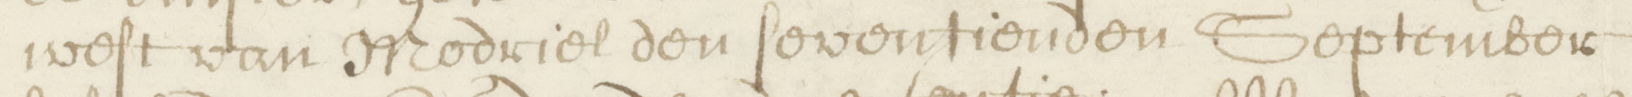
west van modriel den seventienden September
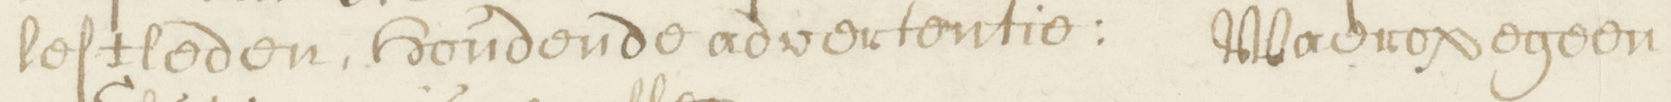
lestleden, houdende advertentie: Waerop egeen
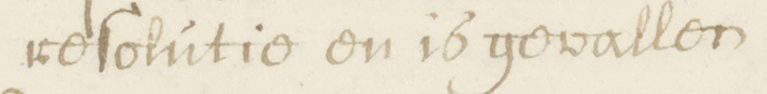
resolutie en is gevallen.
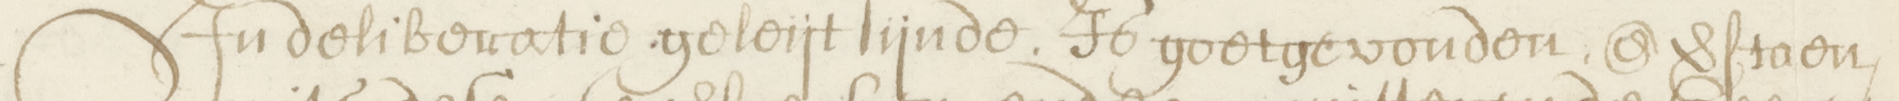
In deliberatie geleijt sijnde, is goetgevonden, & vstaen,
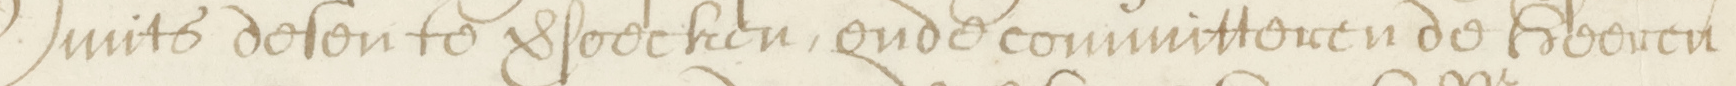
mits desen te vsoecken, ende committeren de heeren
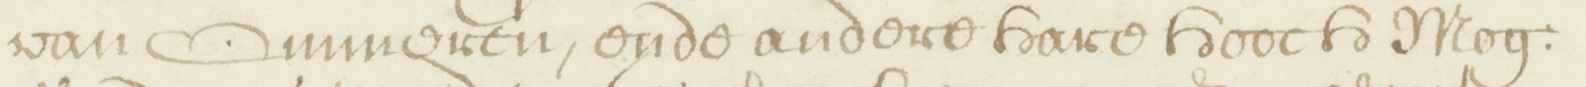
van Ommeren, ende andere hare hooch Mog:
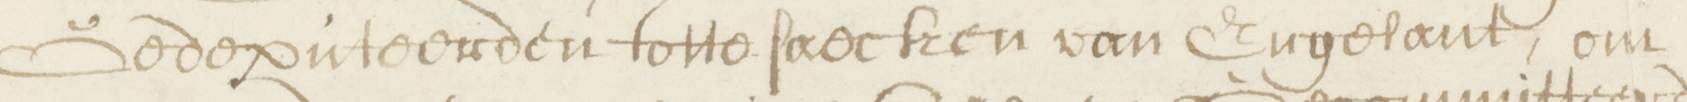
Gedeputeerden totte saecken van Engelant, om
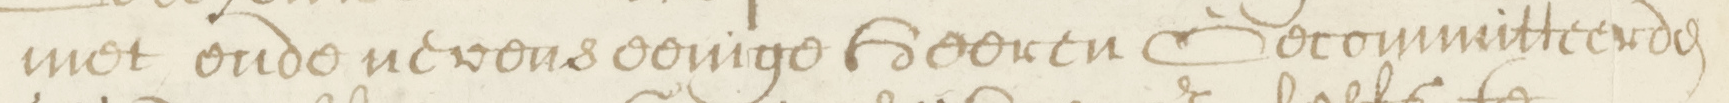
met ende nevens eenige heeren Gecommitteerden
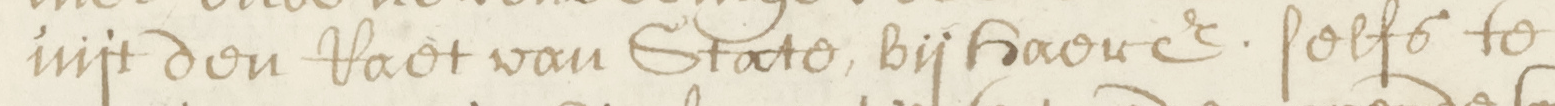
uijt den Raet van State, bij haer E. selfs te
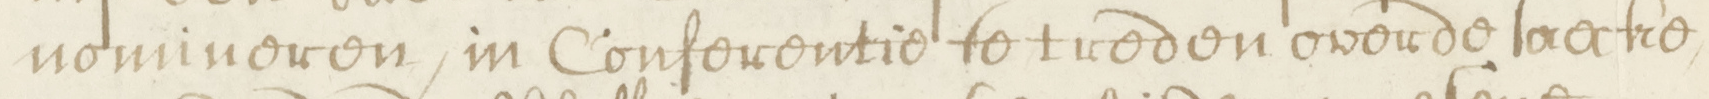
nomineren, in conferentie te treden overde saecke
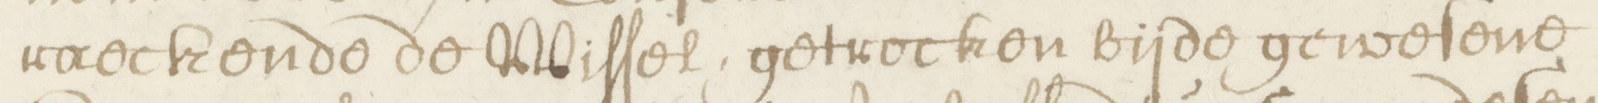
raeckende de Wissel, getrocken bijde gewesene
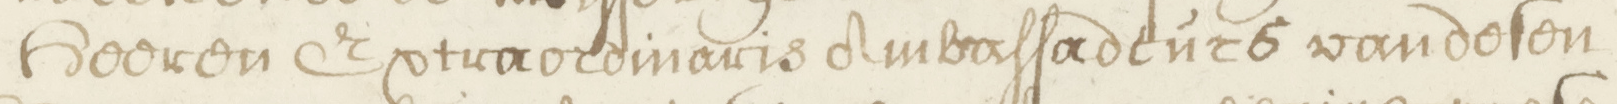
Heeren Extraordinaris Ambassadeurs van desen
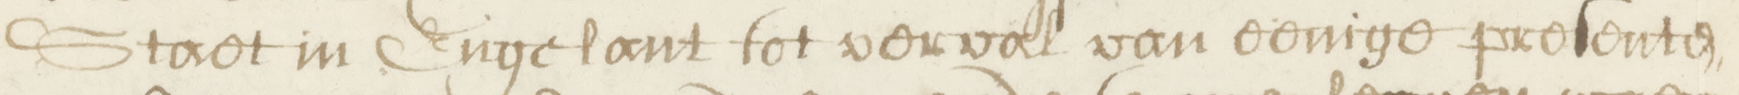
Staet in Engelant tot verval van eenige presenten
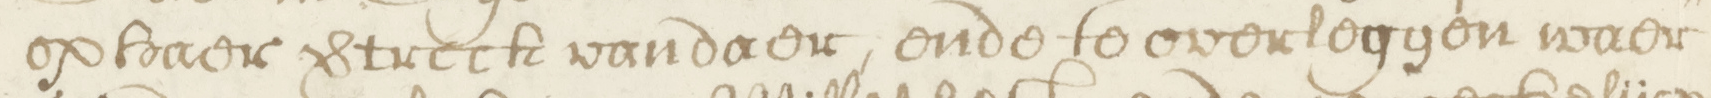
op haer vtreck vandaer ende te overleggen waer
